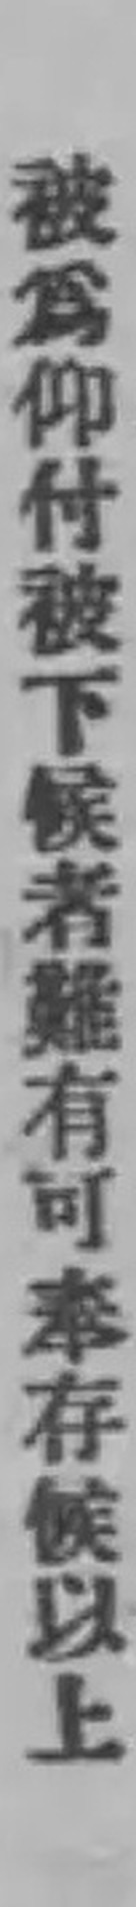被為仰付被下候者難有可奉存候以上
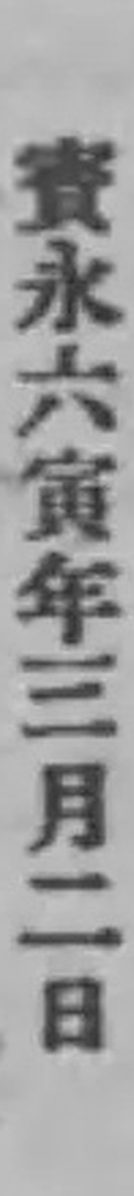宝永六寅年三月二日
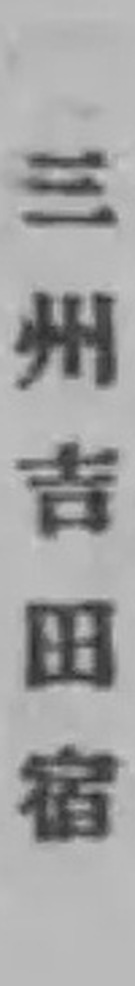三州吉田宿
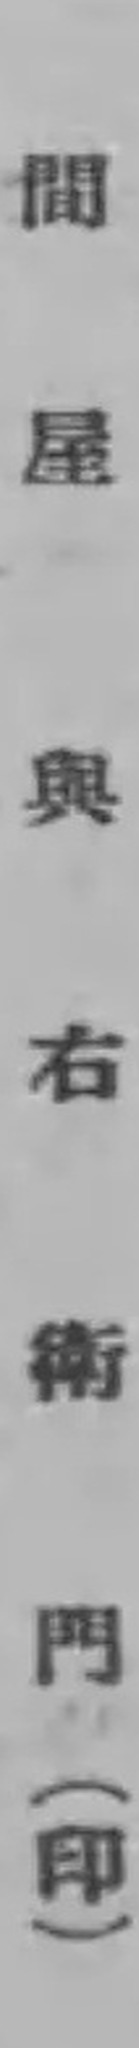問屋與右衛門(印)
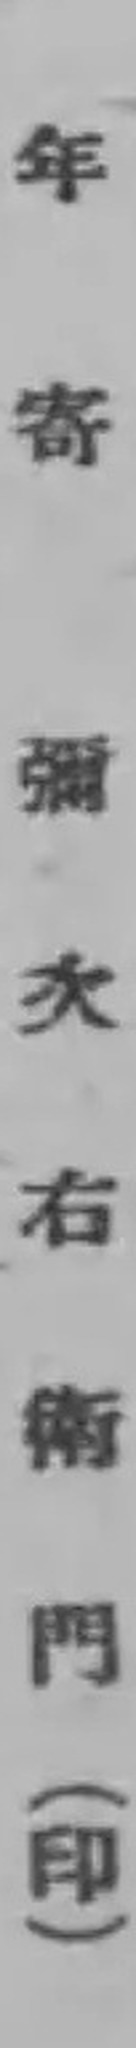年寄彌次右衛門(印)
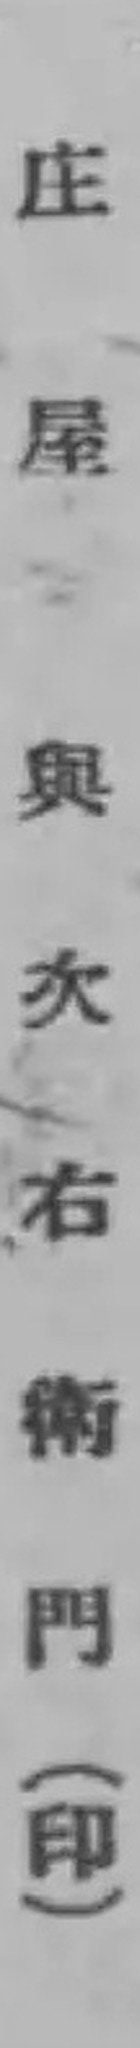庄屋與次右衛門(印)
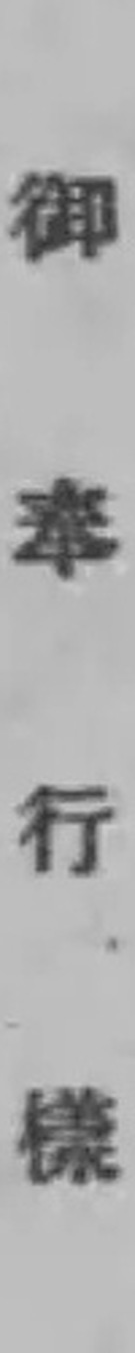御奉行様
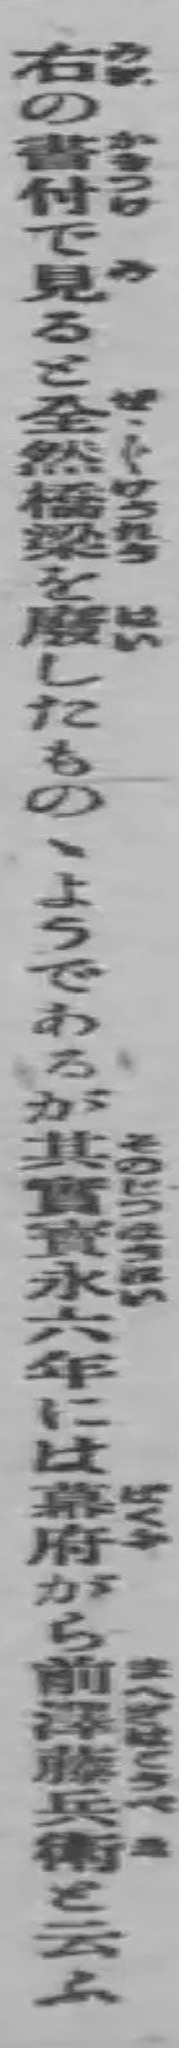右の書付で見ると全然橋梁を廃したものゝようであるが其実宝永六年には幕府がら前澤藤兵衛と云ふ
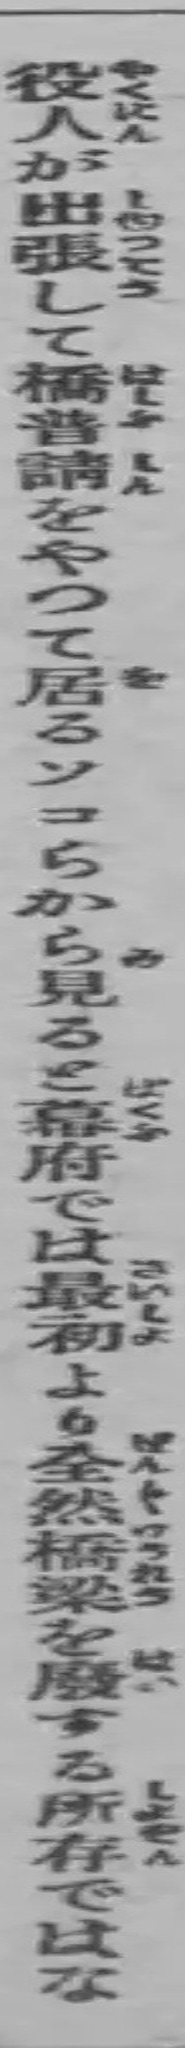役人が出張して橋普請をやつて居るソコらから見ると幕府では最初より全然橋梁を廃する所存ではな
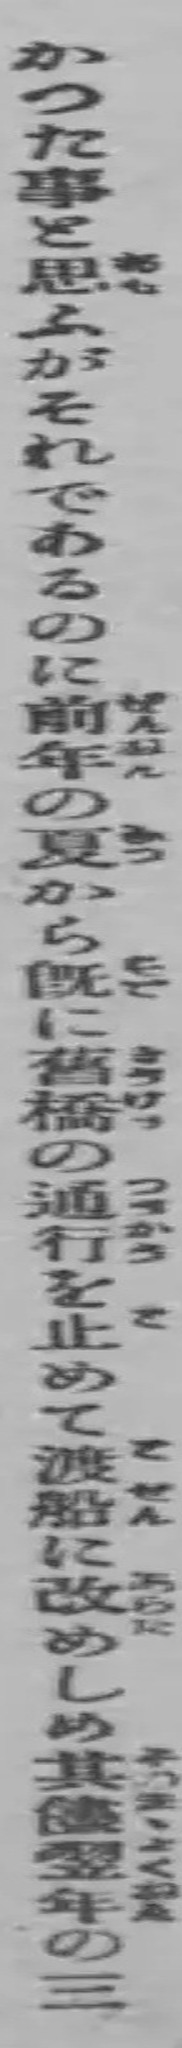かつた事と思ふがそれであるのに前年の夏から既に旧橋の通行を止めて渡船に改めしめ其侭翌年の三
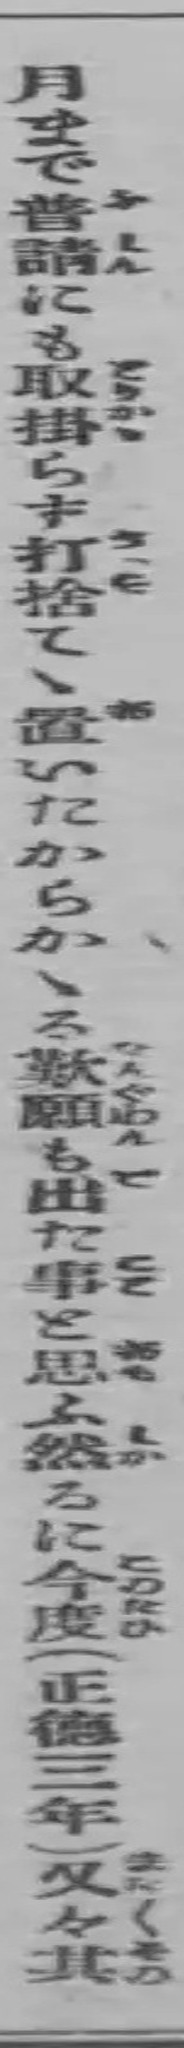月まで普請にも取掛らず打捨てゝ置いたからかゝる歎願も出た事と思ふ然るに今度(正徳三年)又々其
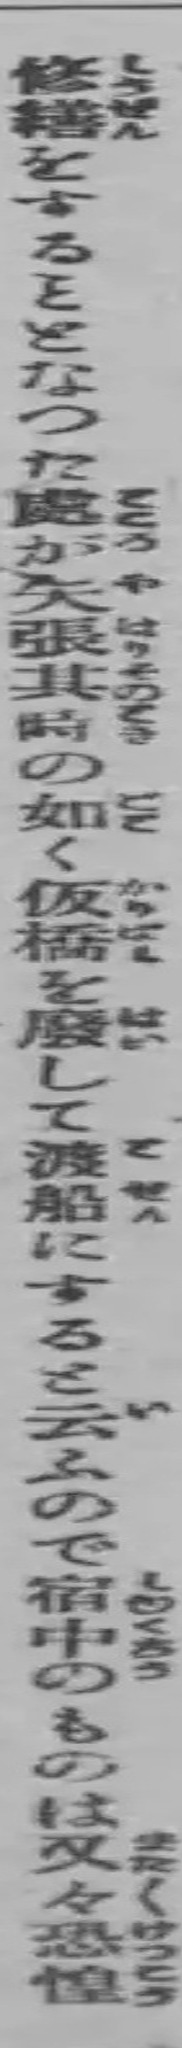修繕をすることとなつた処が矢張其時の如く仮橋を廃して渡船にすると云ふので宿中のものは又々恐惶
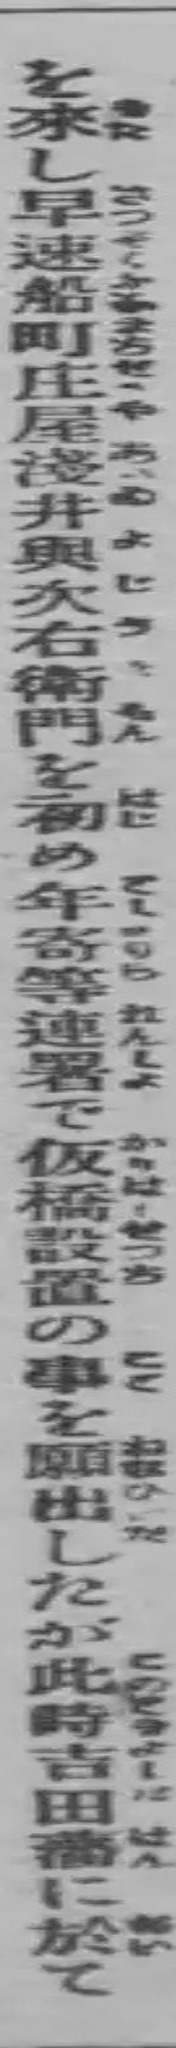を来し早速船町庄屋浅井與次右衛門を初め年寄等連署で仮橋設置の事を願出したが此時吉田藩に於て
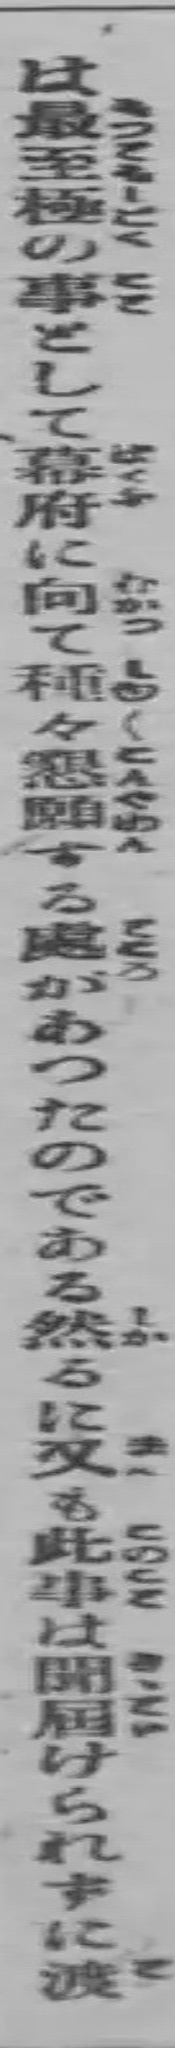は最至極の事として幕府に向て種々懇願する処があつたのである然るに又も此事は聞届けられずに渡
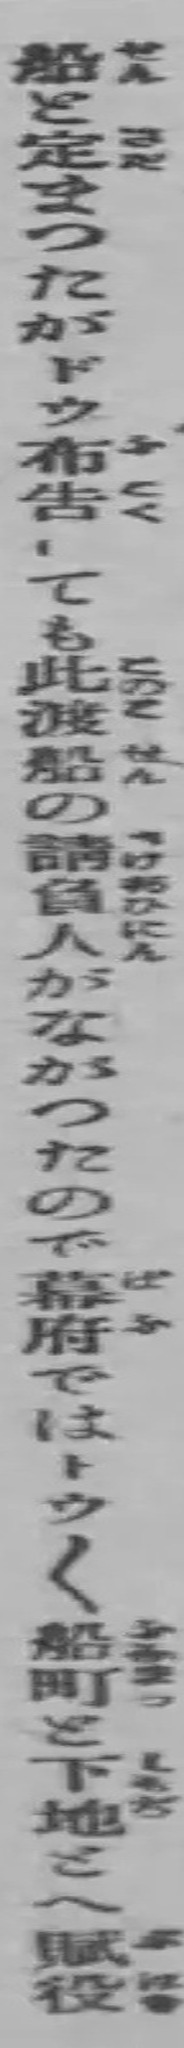船と定まつたがドウ布告しても此渡船の請負人がながつたので幕府ではトウ〳〵船町と下地とへ賦役
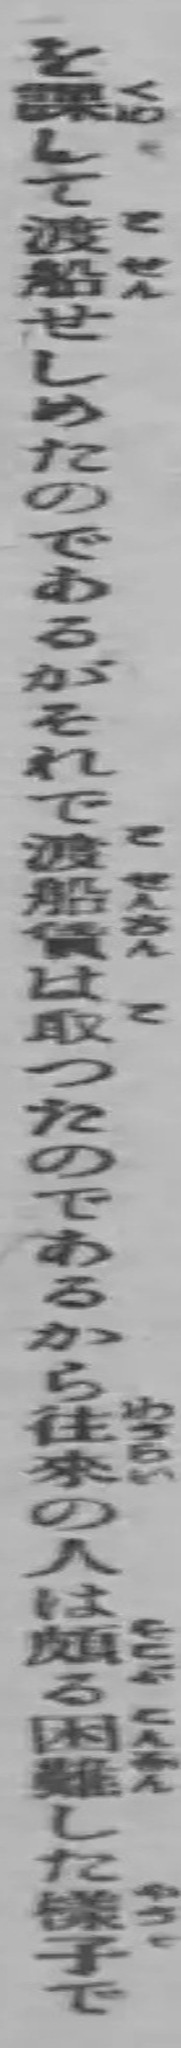を課して渡船せしめたのであるがそれで渡船賃は取つたのであるから往来の人は頗る困難した様子で
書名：豊橋市史談
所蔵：国立国会図書館 National Diet Library, JAPAN
